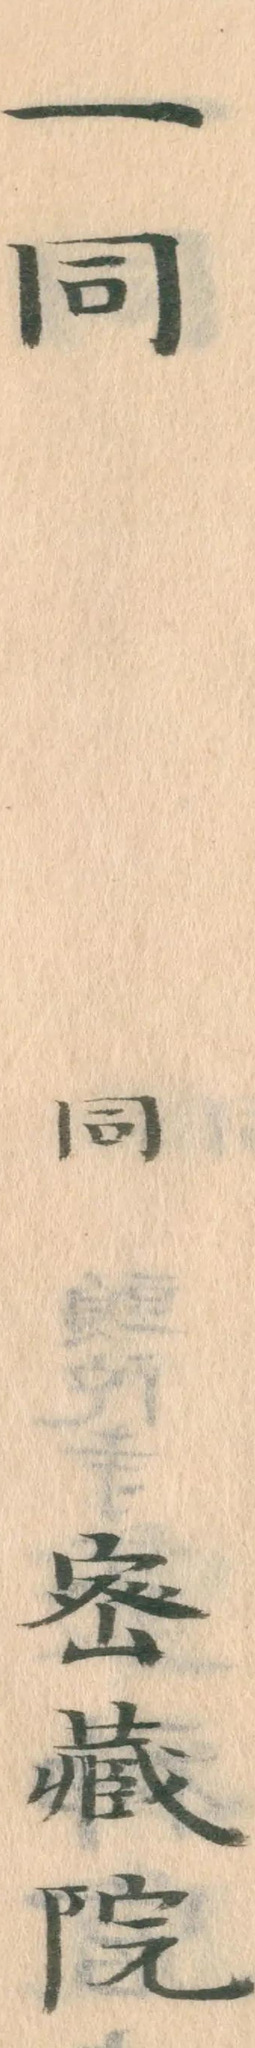一同同密蔵院
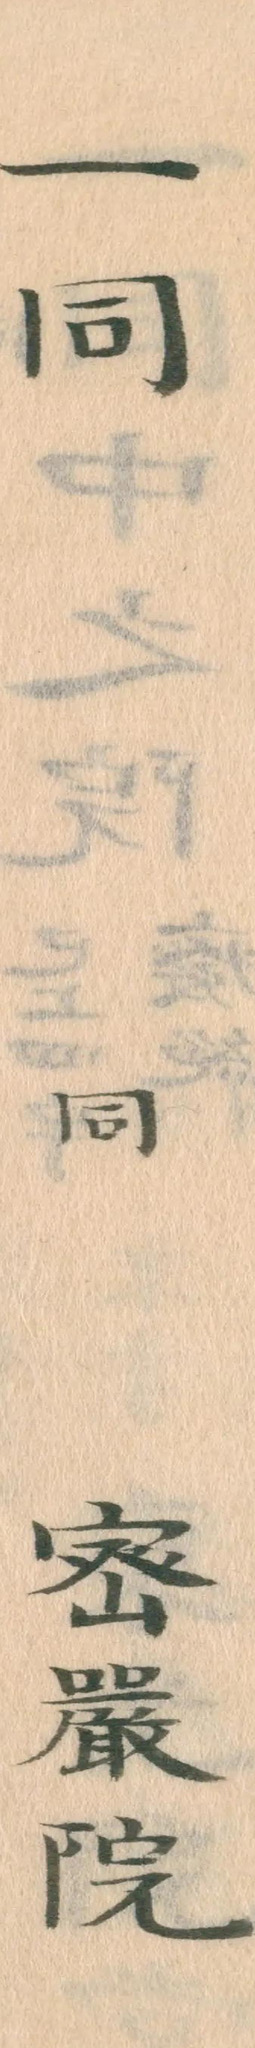一同同密蔵院
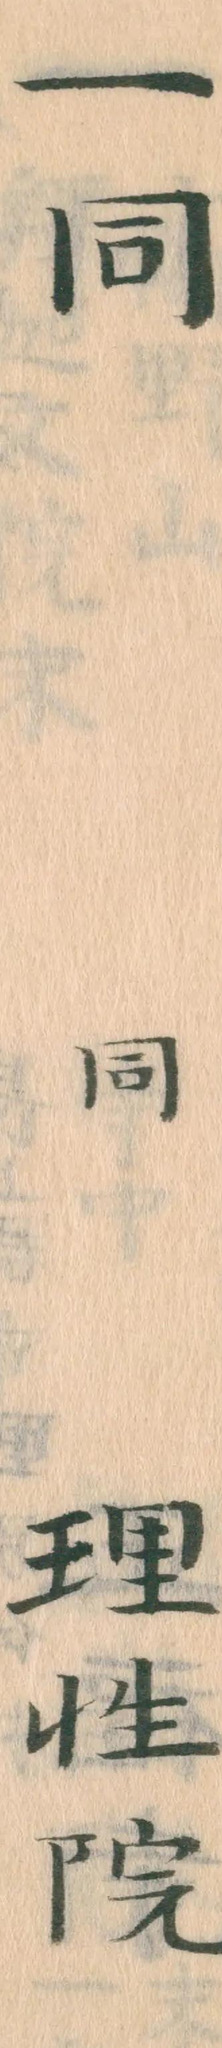一同同理性院
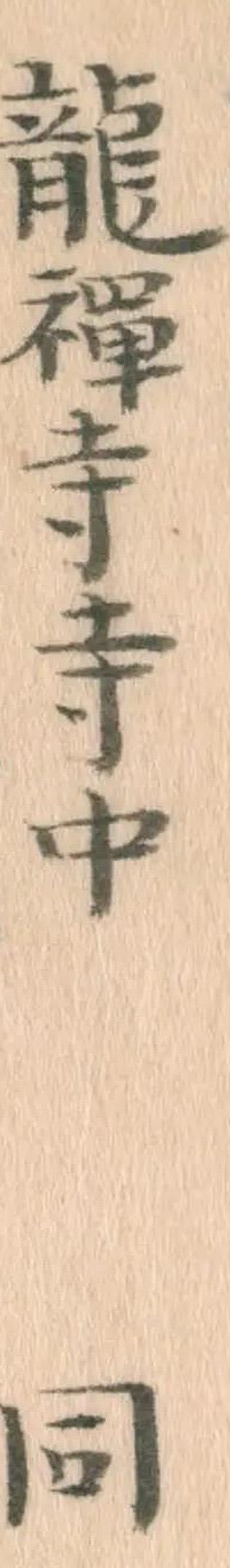龍禅寺寺中同同
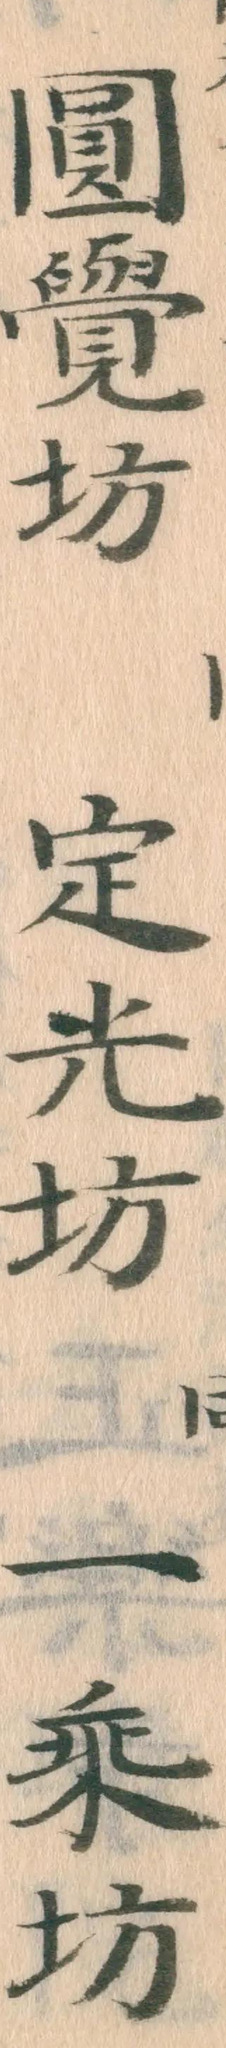圓覚坊定光坊一乗坊
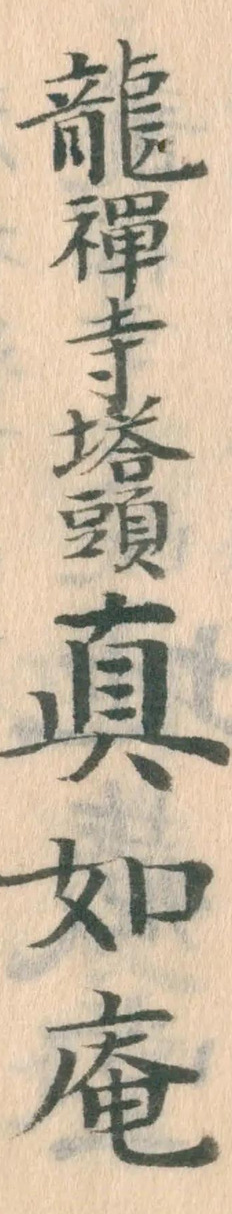龍禅寺塔頭真如庵

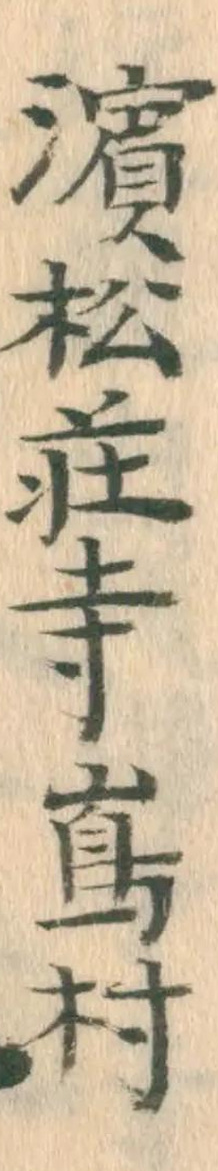浜松荘寺嶋村
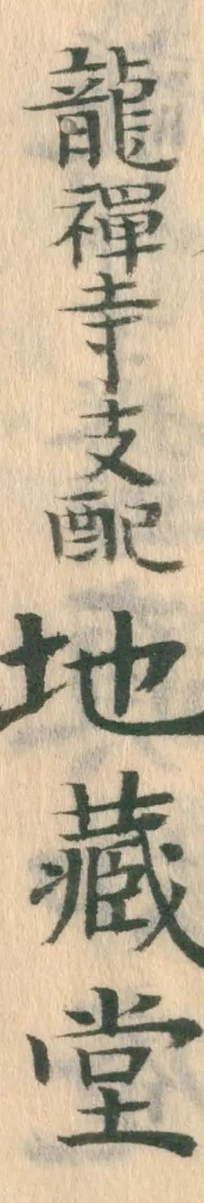龍禅寺支配地蔵堂
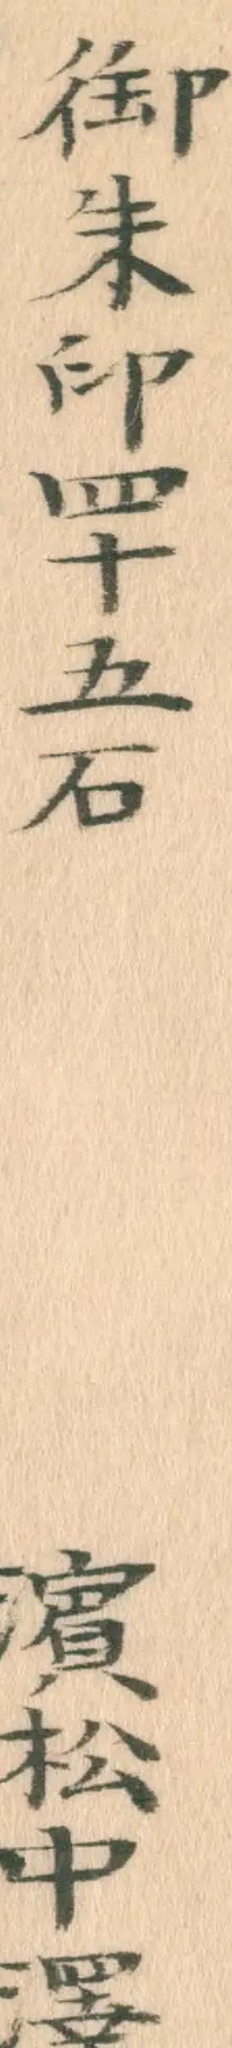御朱印四十五石浜松中沢
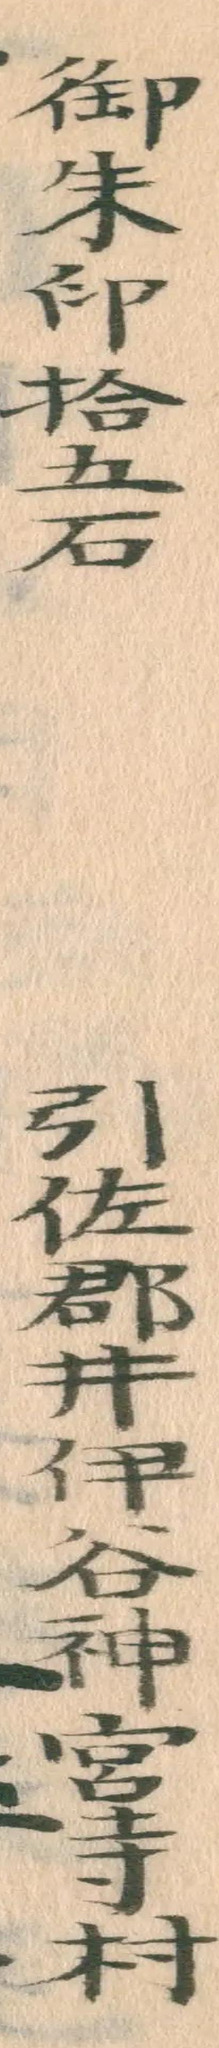御朱印拾五石引佐郡伊谷神宮寺村
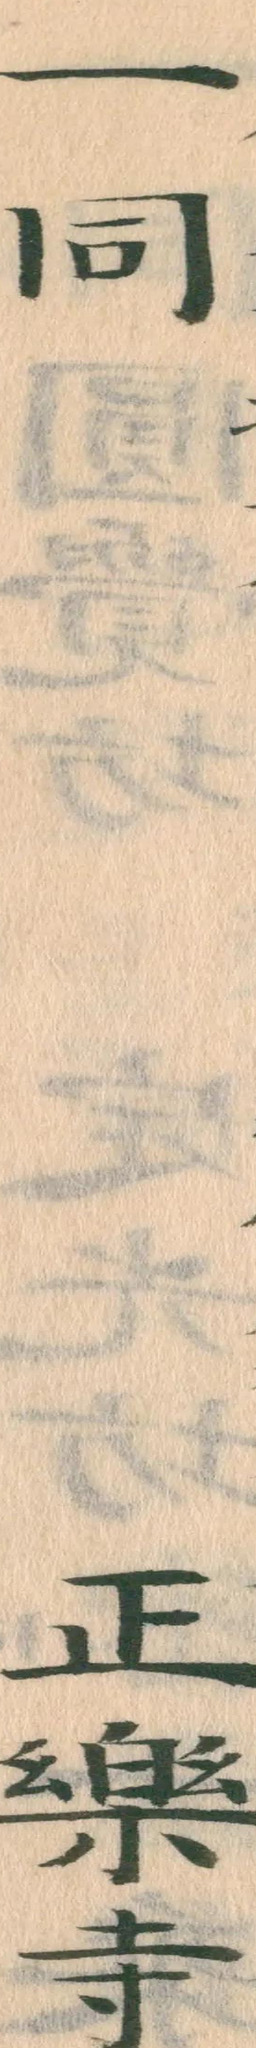一同正楽寺
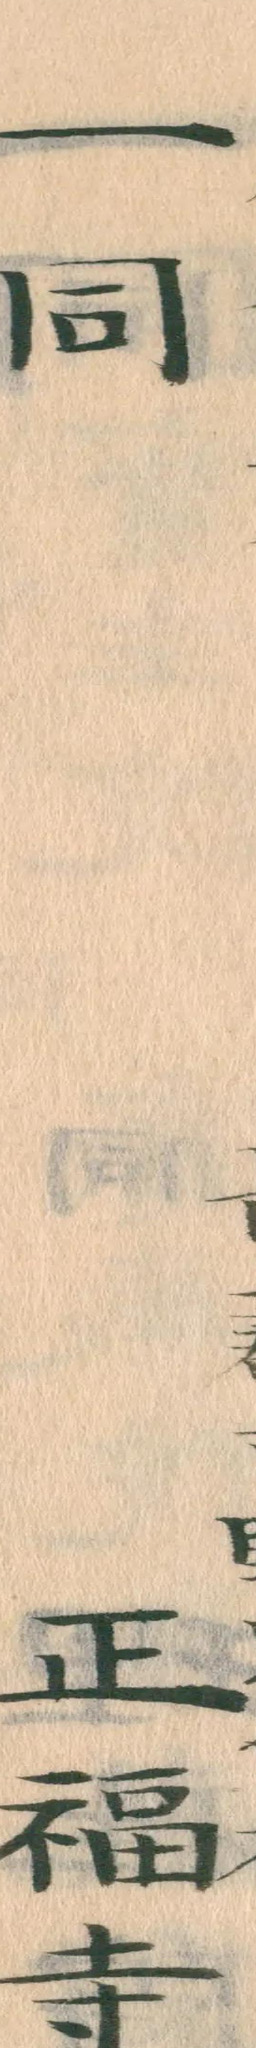一同正福寺
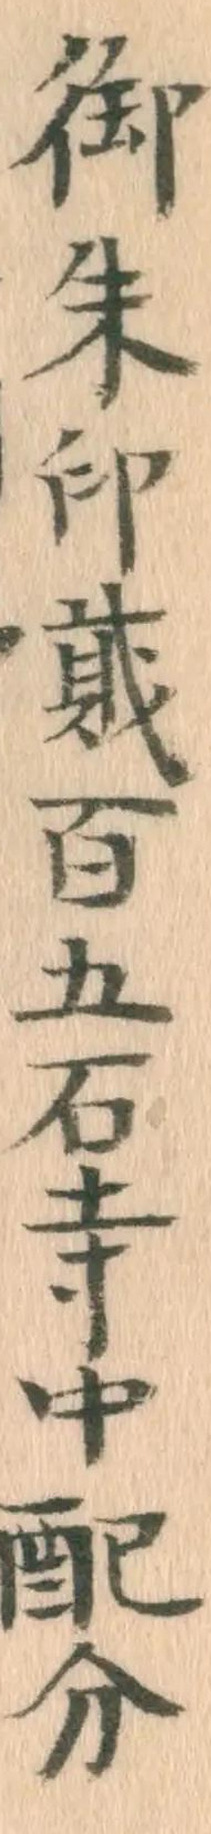御朱印百五石寺中配分
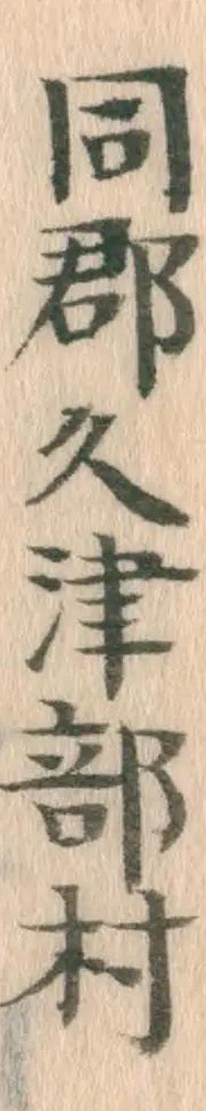同郡久津部村
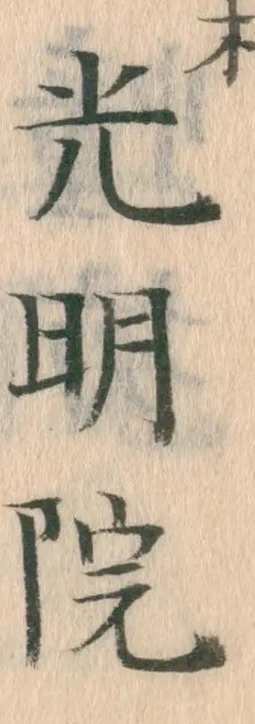光明院
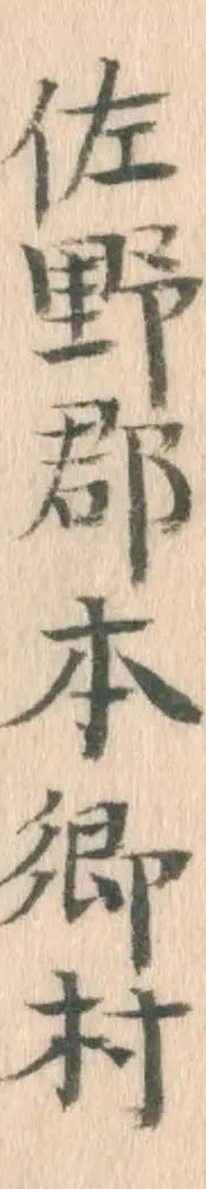佐野郡本郷村
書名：古義真言宗本末帳 21巻. [4] 第三 伊賀国、伊勢国、志摩国、尾張国、三河国、遠江国、駿河国、伊豆国、甲斐国
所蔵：国立国会図書館 National Diet Library, JAPAN
